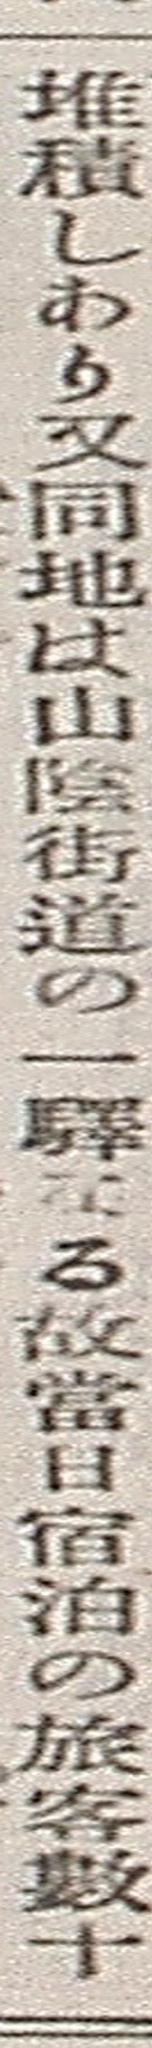堆積しあり又同地は山陰街道の一駅なる故当日宿泊の旅客数十
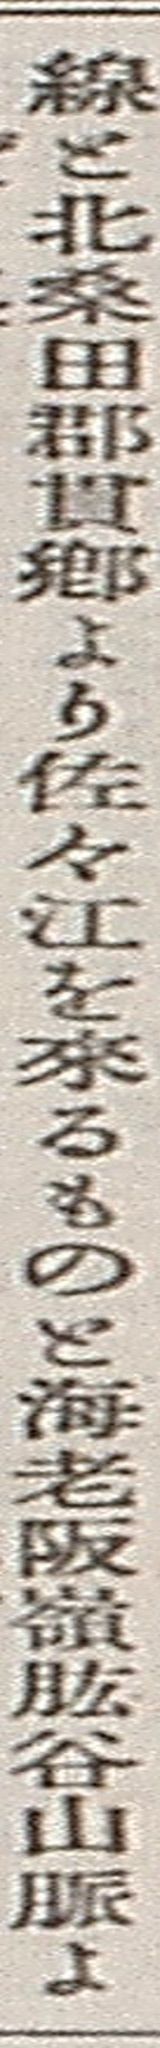線と北桑田郡貫郷より佐々江を来るものと海老阪嶺肱谷山脈よ
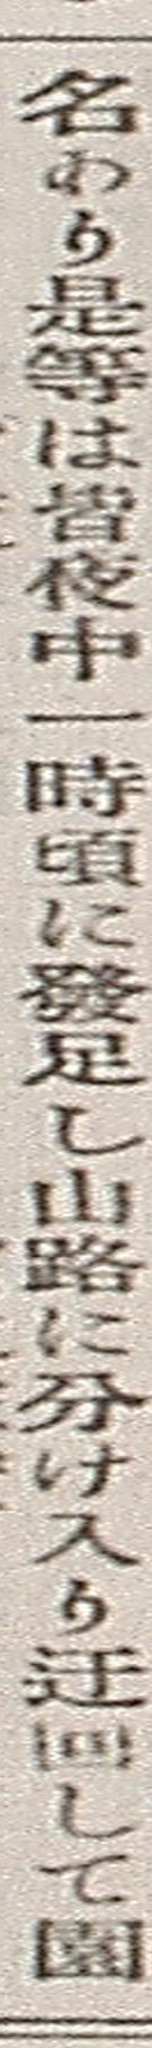名あり是等は皆夜中一時頃に発足し山路に分け入り迂回して園
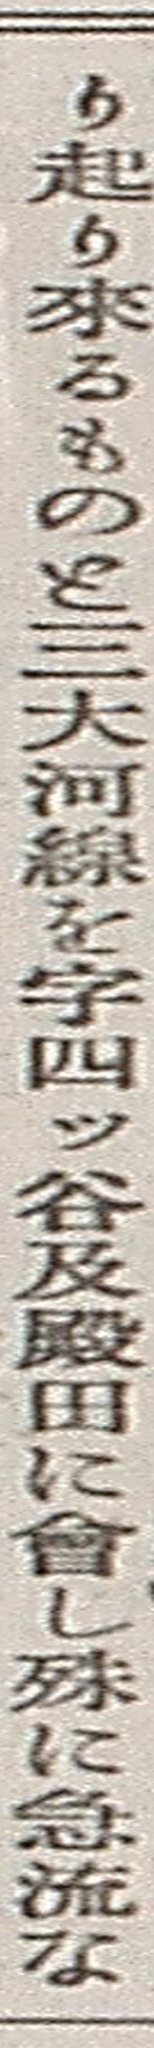り起り来るものと三大河線を字四ッ谷及殿田に会し殊に急流な
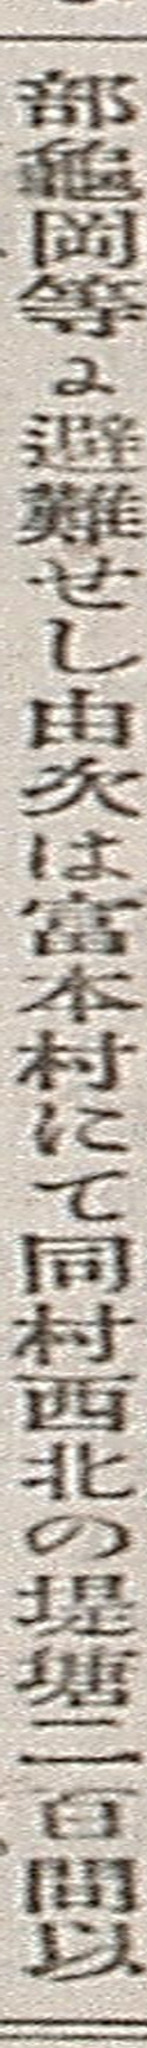部亀岡に避難せし由次は富本村にて同村西北の堤塘二百間以
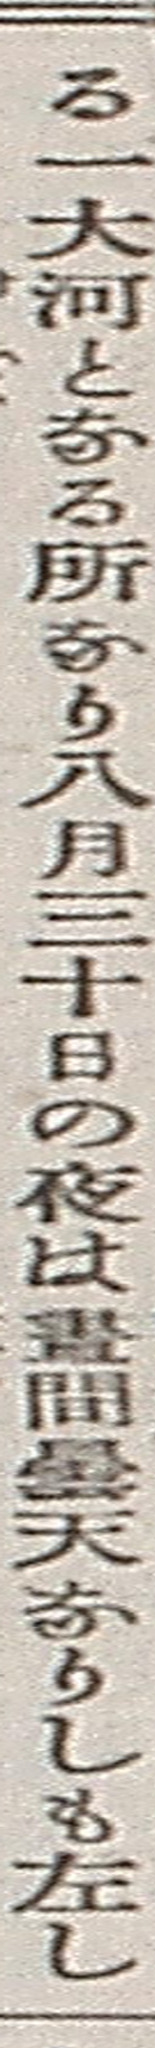る一大河となる所なり八月三十日の夜は晝間曇天なりしも左し
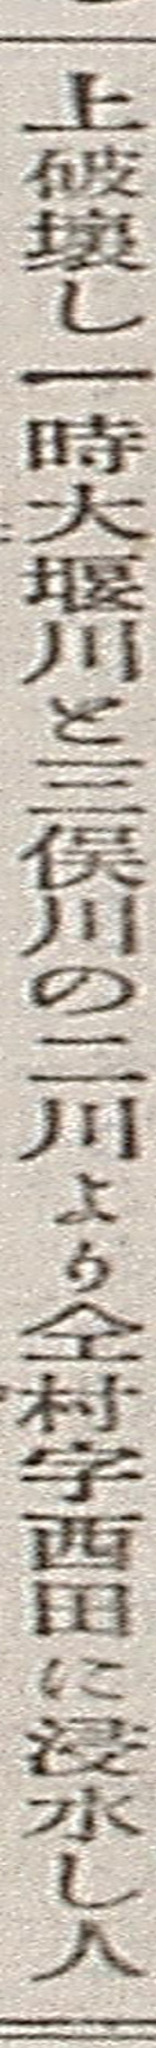上破壊し一時大堰川と三俣川の二川より同村字西田に浸水し人
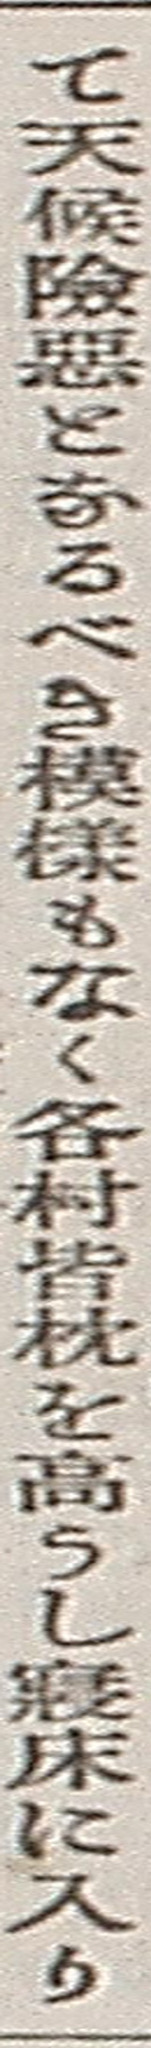て天候険悪となるべき模様もなく各村皆枕を高うし寝床に入り
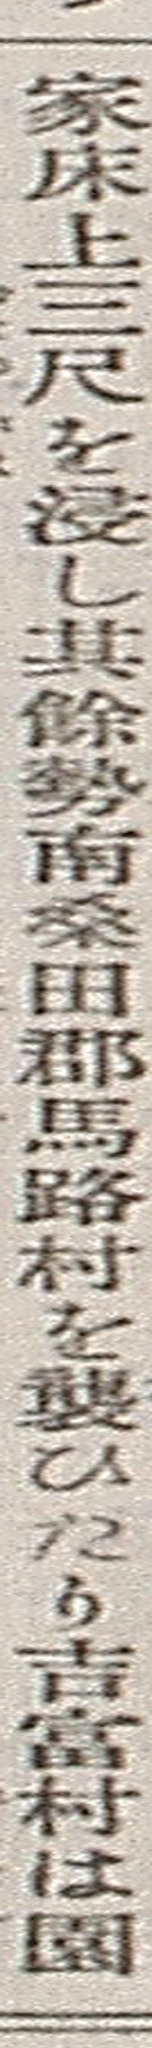家床上三尺を浸し其餘勢南桑田郡馬路村を襲ひたり吉富村は園
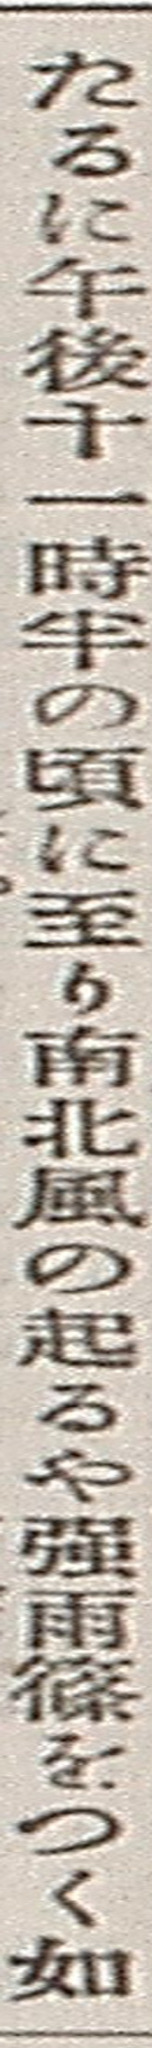たるに午後十一時半の頃に至り南北風の起るや強雨篠をつく如
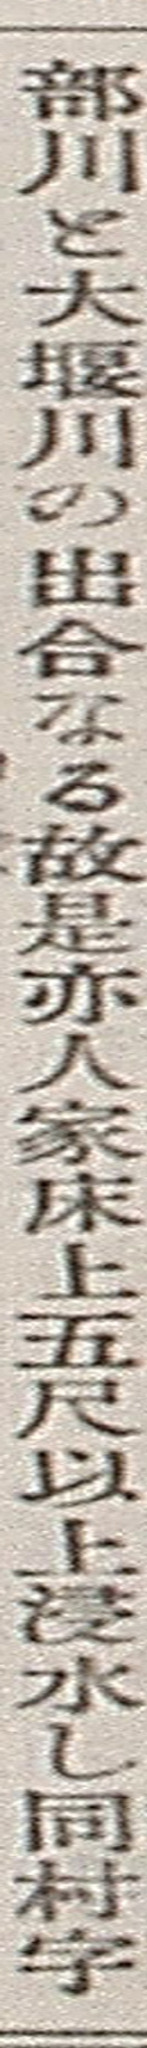部川と大堰川の出合なる故是亦人家床上五尺以上浸水し同村字
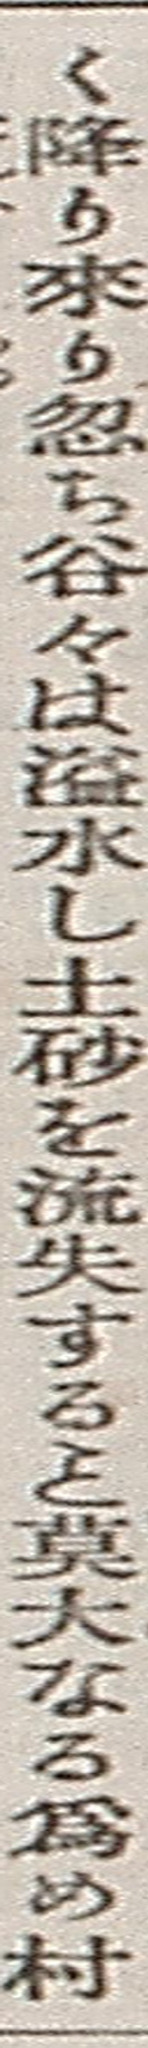く降り来り忽ち谷々は溢水し土砂を流失すること莫大なる為め村
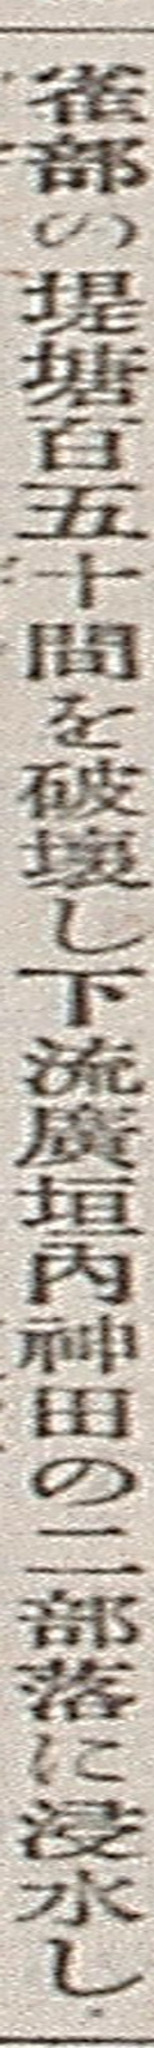雀部の堤塘百五十間を破壊し下流広垣内神田の二部落に浸水し
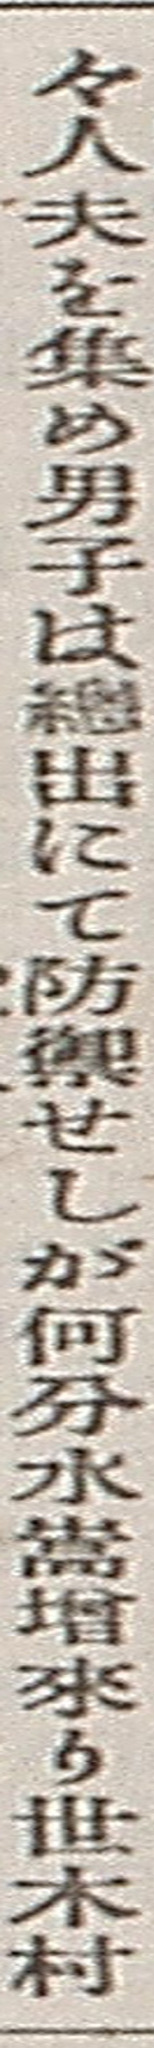々人夫を集め男子は総出にて防禦せしが何分水嵩増来りセ木村
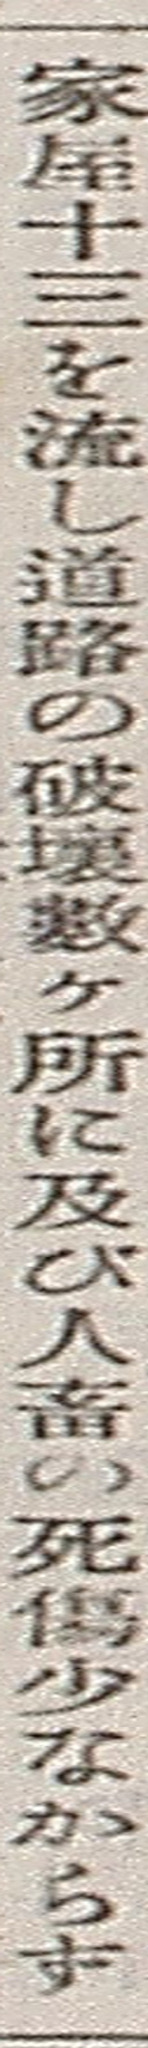家屋十三を流し道路の破壊数ヶ所に及び人畜の死傷少なからず
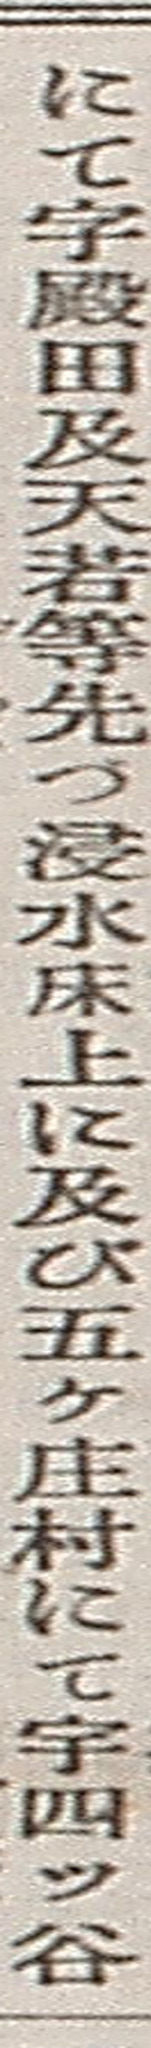にて宇殿田及天岩等先づ浸水床上に及び五ヶ庄村にて字四ッ谷
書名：風俗畫報臨時増刊第百二十六號　洪水被害録（中）
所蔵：東京大学地震研究所図書室 Earthquake Research Institute Library, The University of Tokyo, JAPAN
